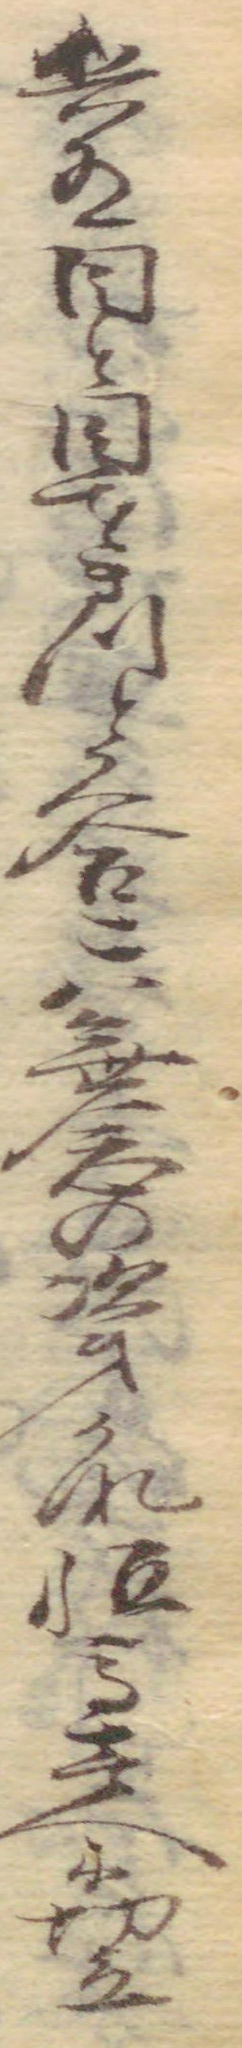兵有目と目をきつと見合こは無念の次第かな恒高壱人に切立
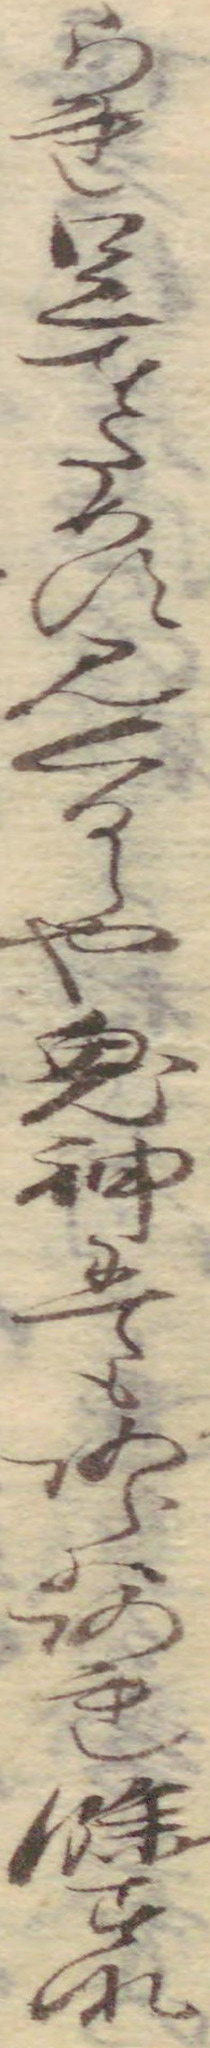られ足をためす見くるしや鬼神にてもあらはあれ余すな
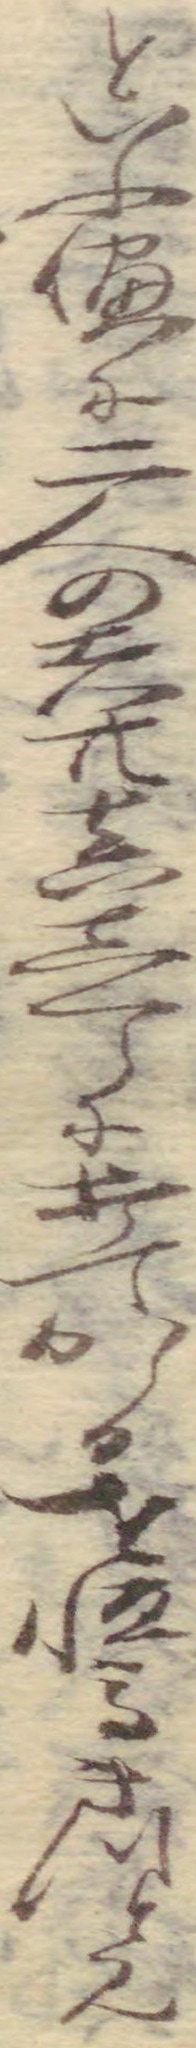といふ儘に二人の者共真しくらに打てかゝるを恒高きつと見
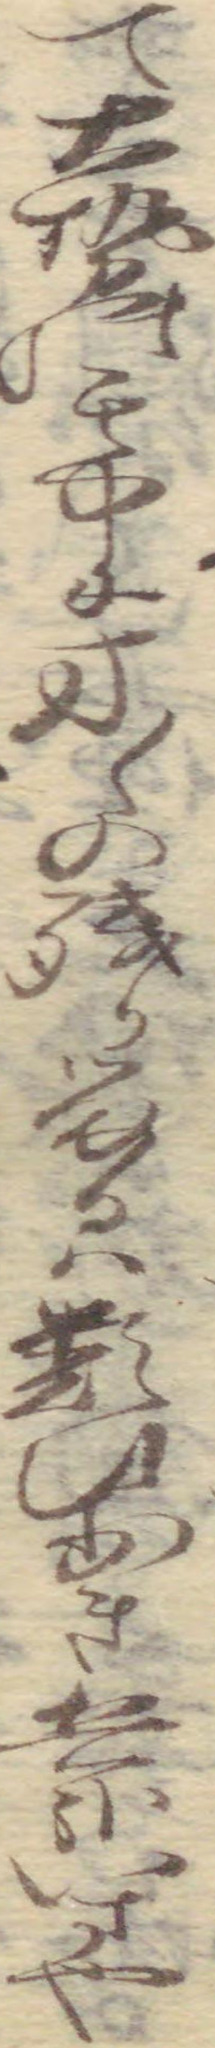て大勢の其中に方々の残り留るは類ひ少き兵哉いさや
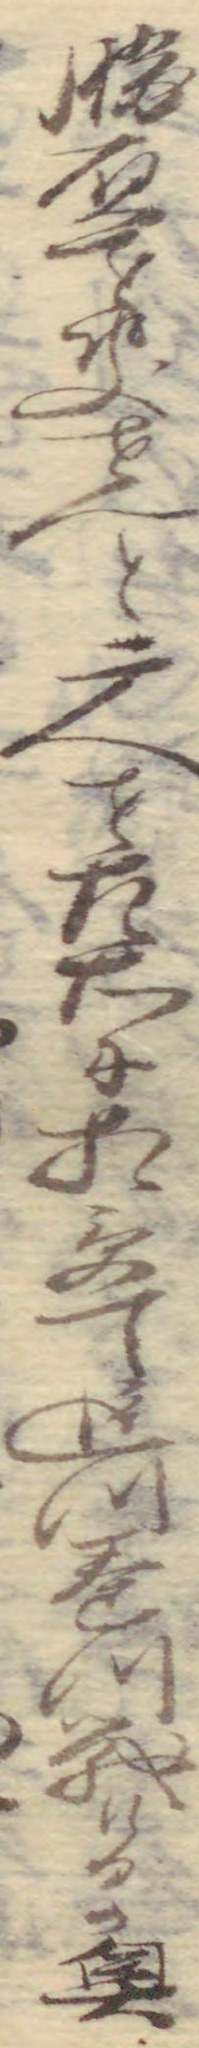勝負を決せんと二人を左右に相受て追つ巻つ戦けるか奥
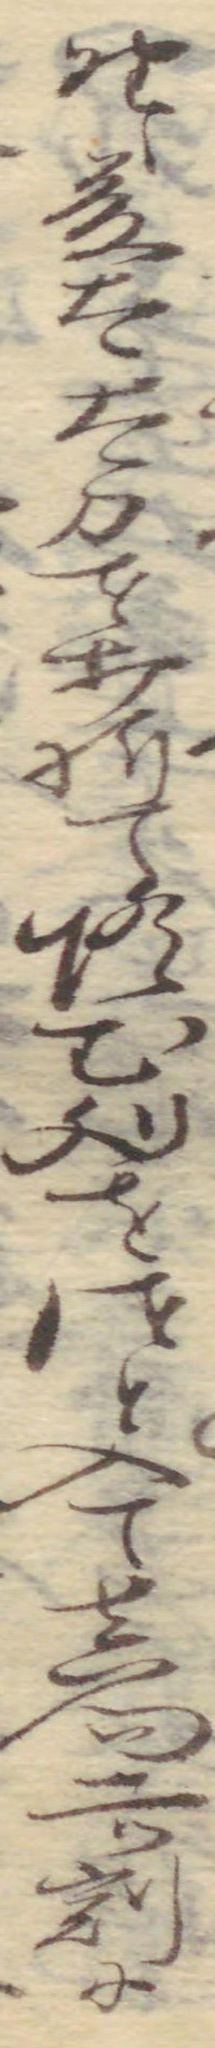野々藤太太刀を打折て怪む処をつと入て真向二ツ割に
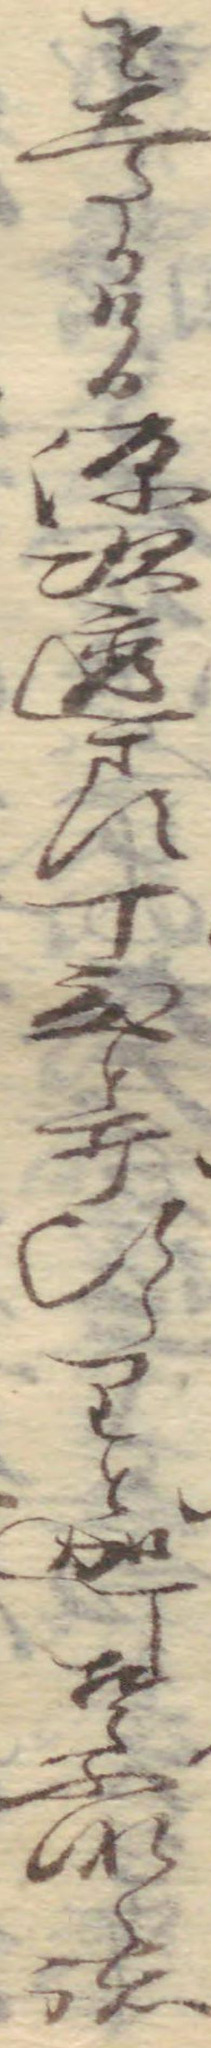そしたりける源次透さす丁度と打ひらりと逃しそふなく諸
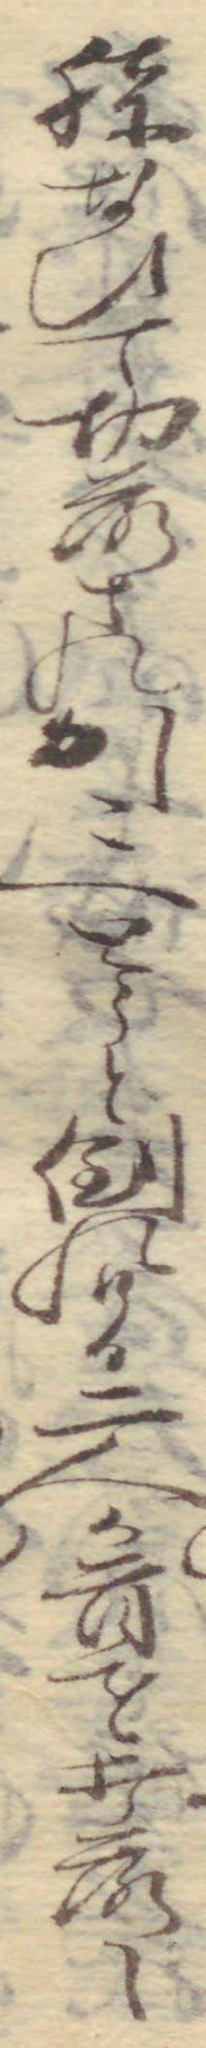膝なひて切落されかしこへとうと倒れける二人か首を打落し
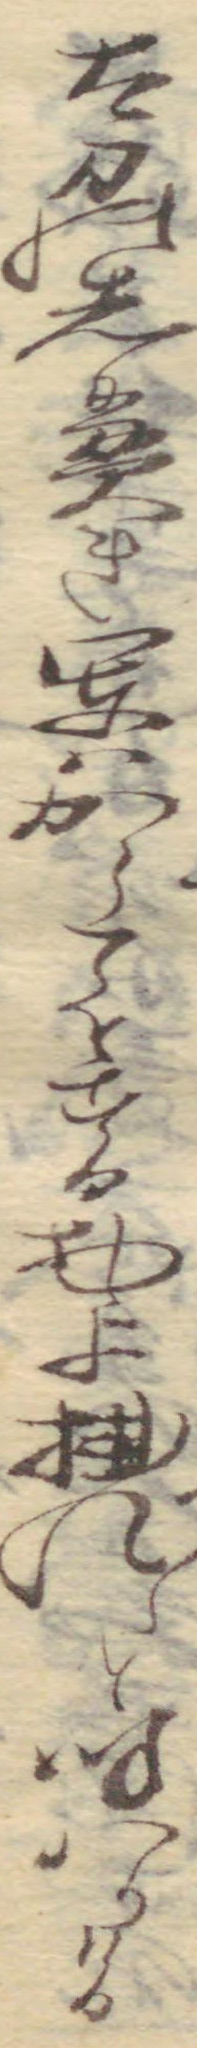太刀の先に貫き軍はかくこそする物よ掛れ〳〵と呼はりける
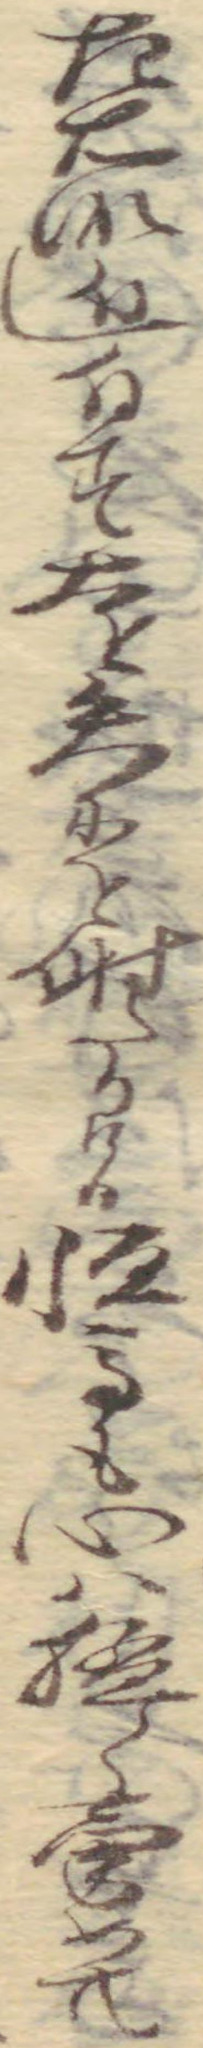左右な近付そ遠矢にそ射たりける恒高も心は猛く勇め共
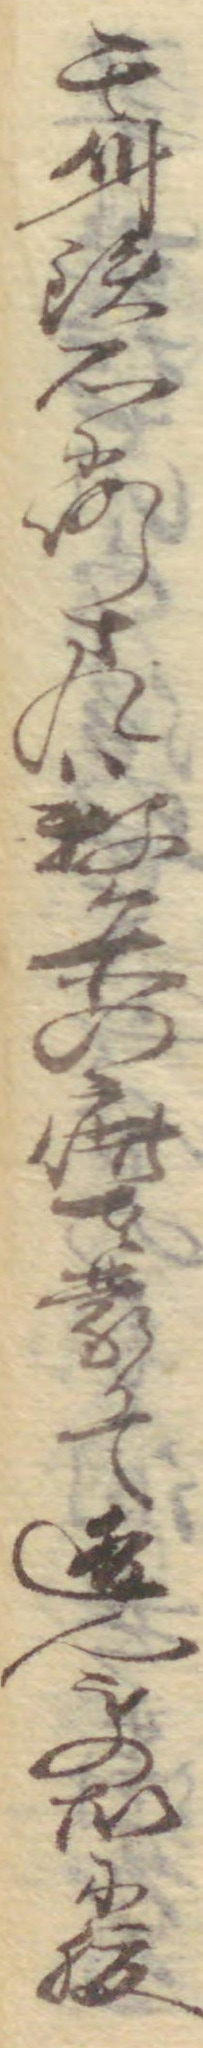其身鉄石にあらされは数ケ所の疵を蒙りて遁んもの故に腹
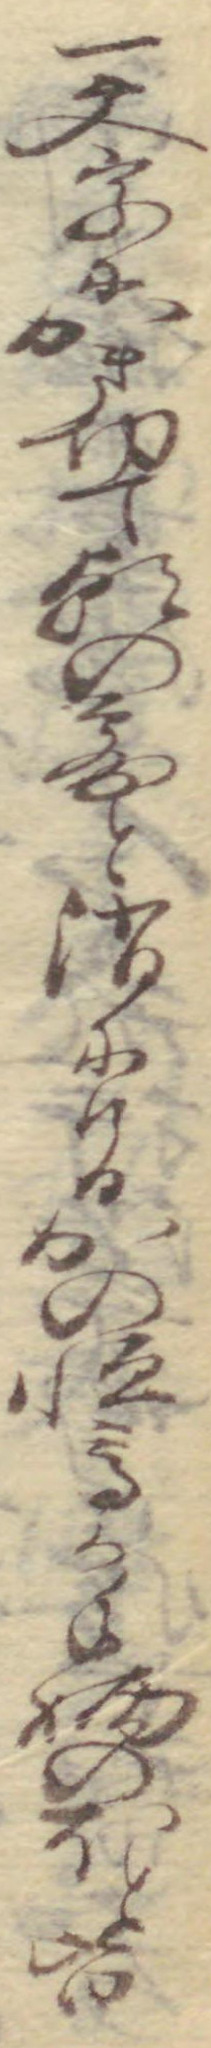一文字にかき切て朝の露と消にけるかの恒高か手柄のほと皆
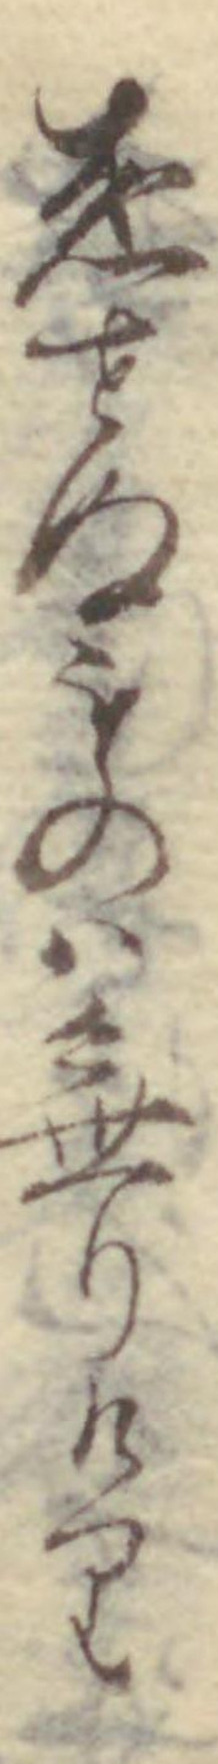感せぬものは無りけり
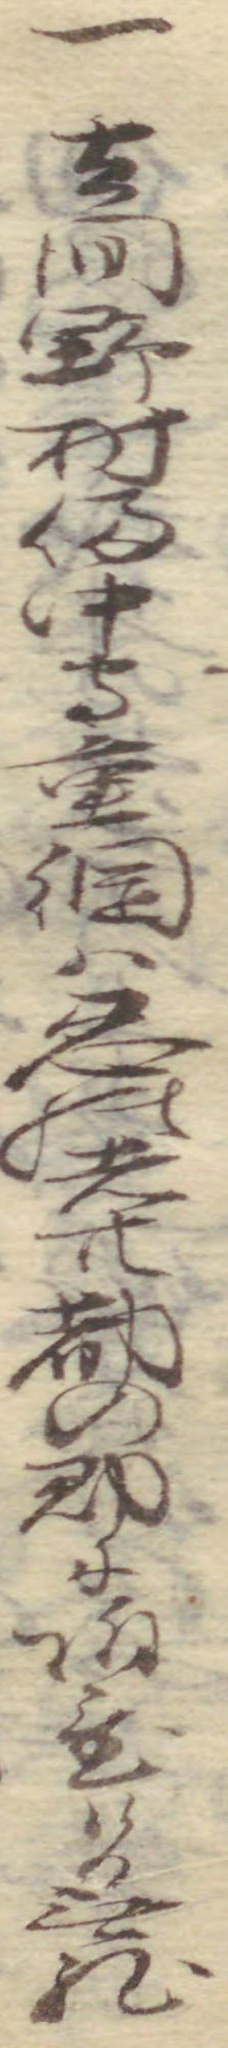一去間野村備中守重綱は忍の者共都の郡に附置ける無程
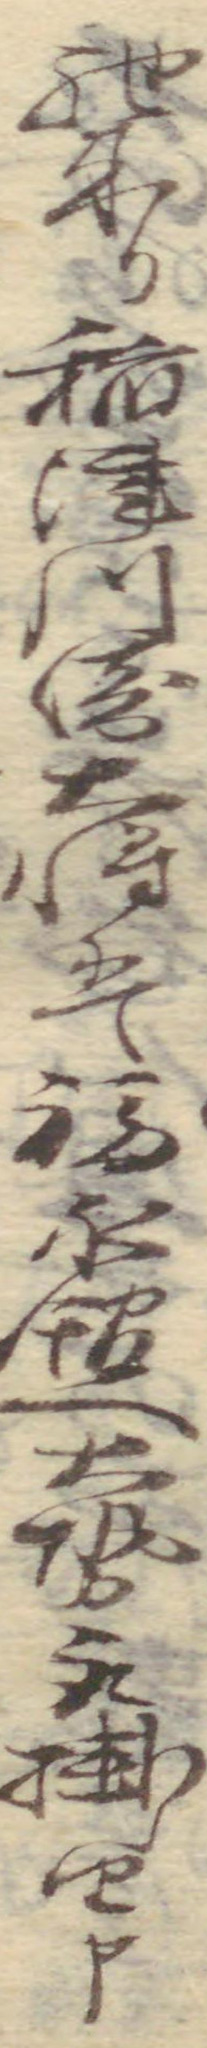馳来り稲津川崎大将にて福永館へ大勢取掛し由申
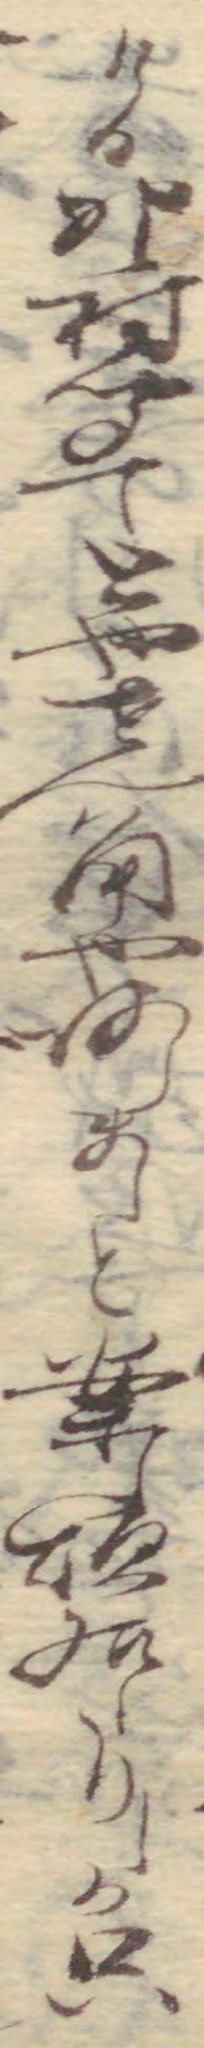ける野村聞てとやせん角やあらましと案し煩居たりしか只
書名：鶯宿雑記. 巻199-200
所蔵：国立国会図書館 National Diet Library, JAPAN
